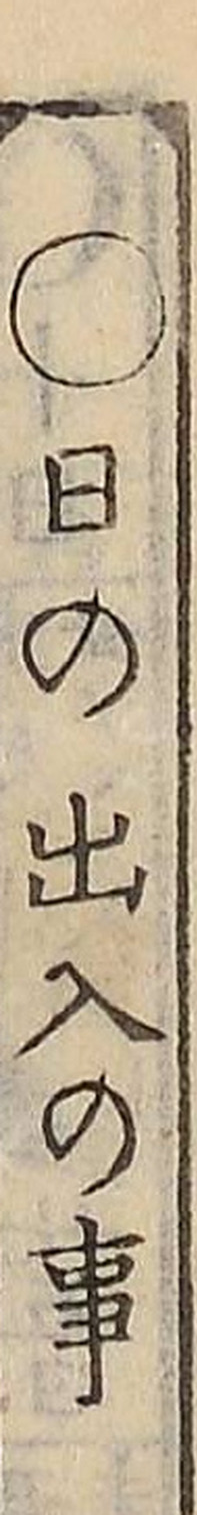○日の出入の事
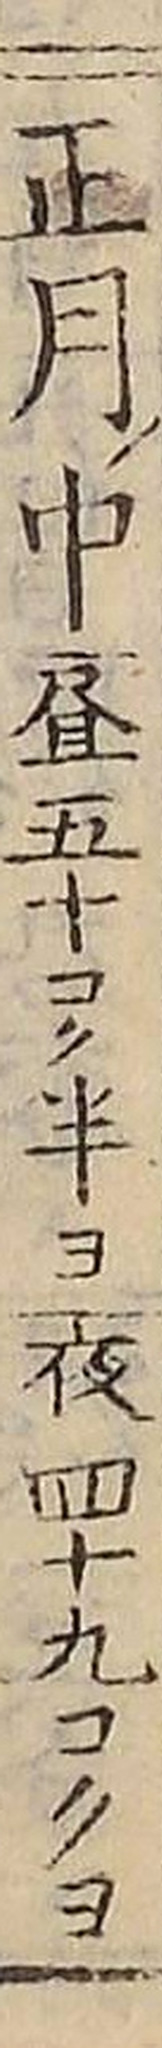正月中昼五十コク半ヨ夜四十九コクヨ
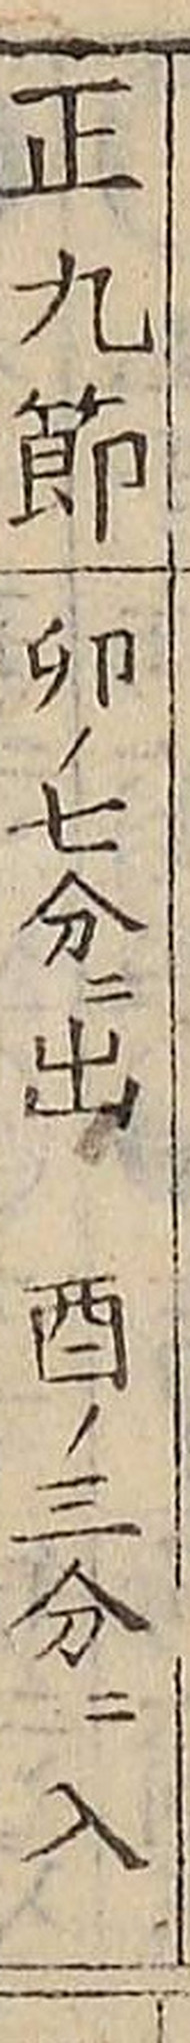正九節卯ノ七分出酉ノ三分入
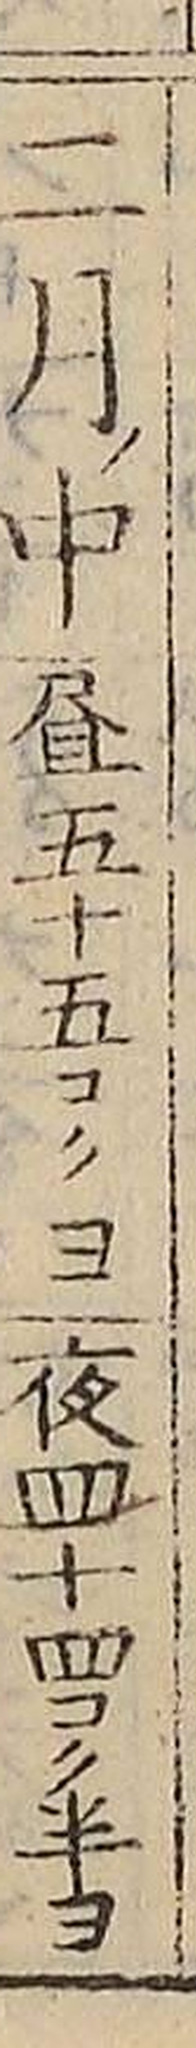二月中昼五十五コクヨ夜四十四コク半ヨ
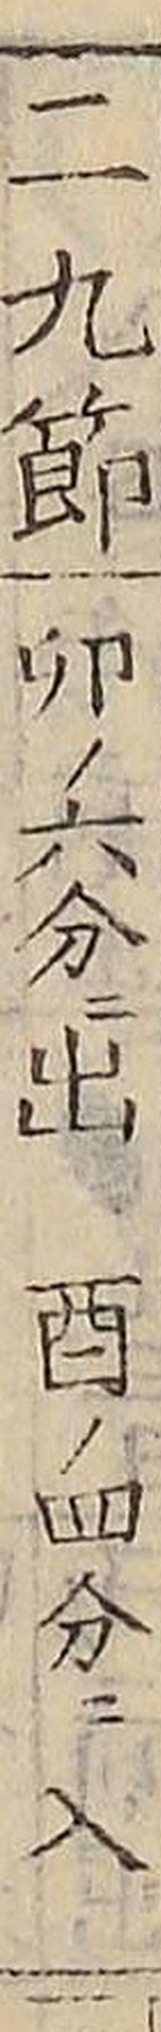二九節卯ノ六分出酉ノ四分入
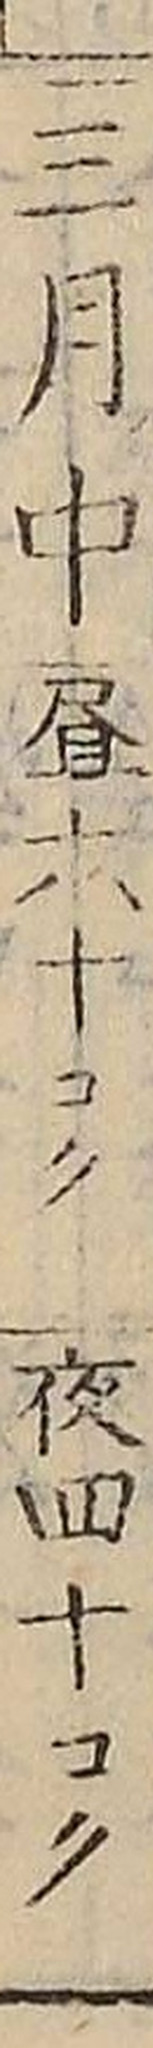三月中昼六十コク夜四十コク
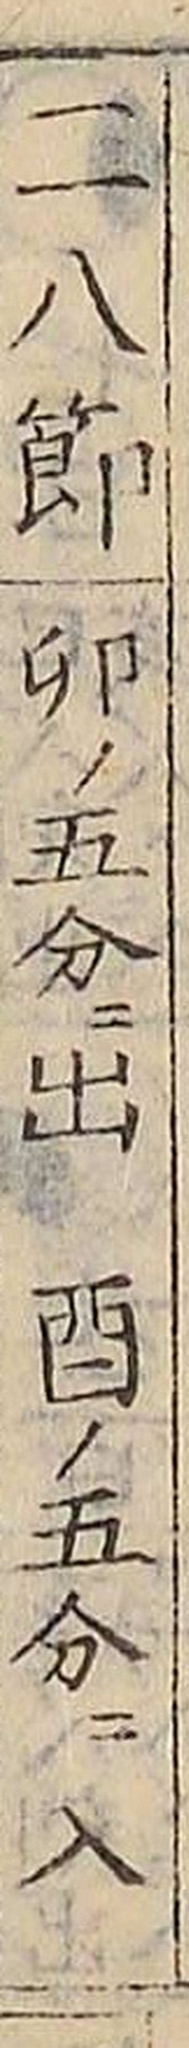二八節卯ノ五分出酉ノ五分入
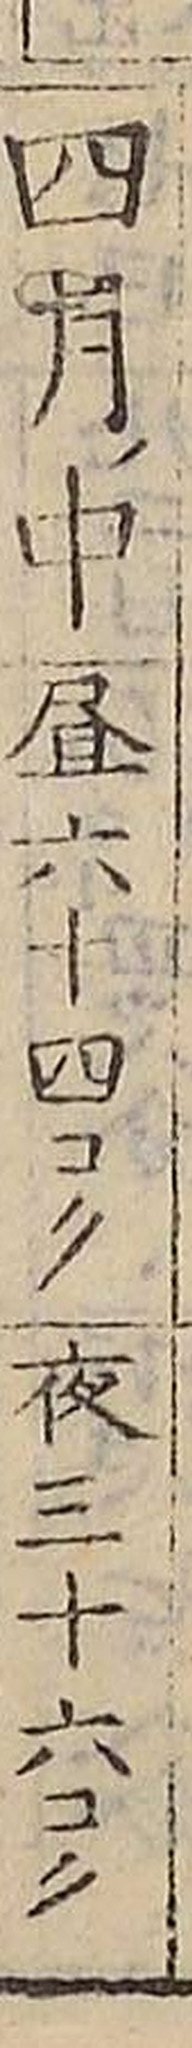四月中昼六十四コク夜三十六コク
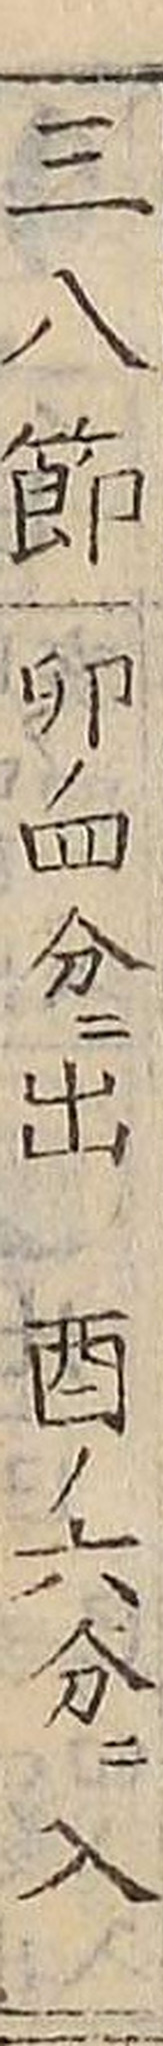三八節卯ノ四分出酉ノ六分入
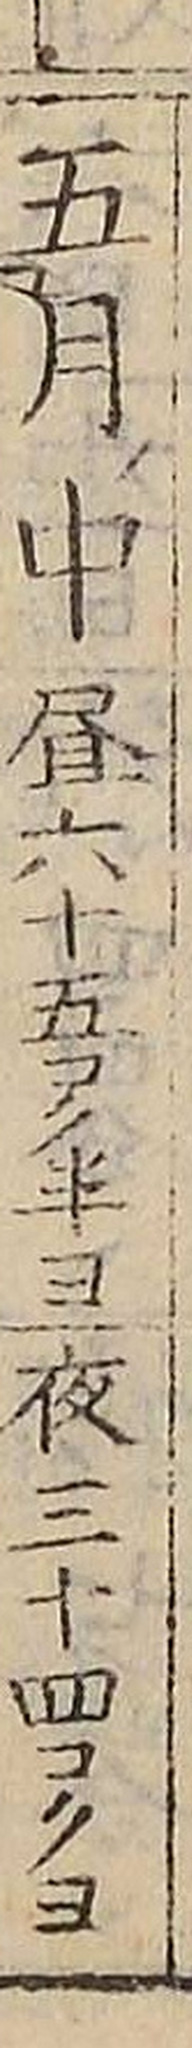五月中昼六十五コク半ヨ夜三十四コクヨ
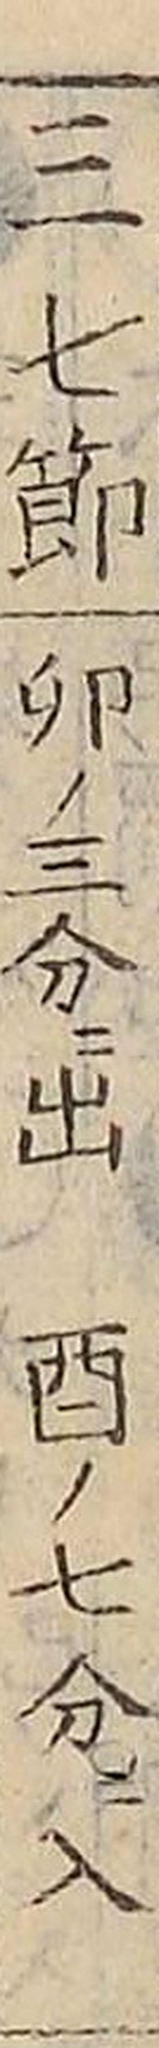三七節卯ノ三分出酉ノ七分入
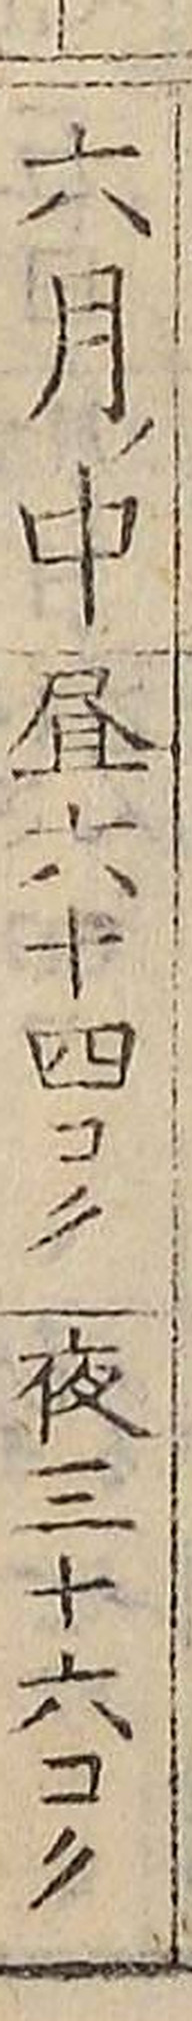六月中昼六十四コク夜三十六コク
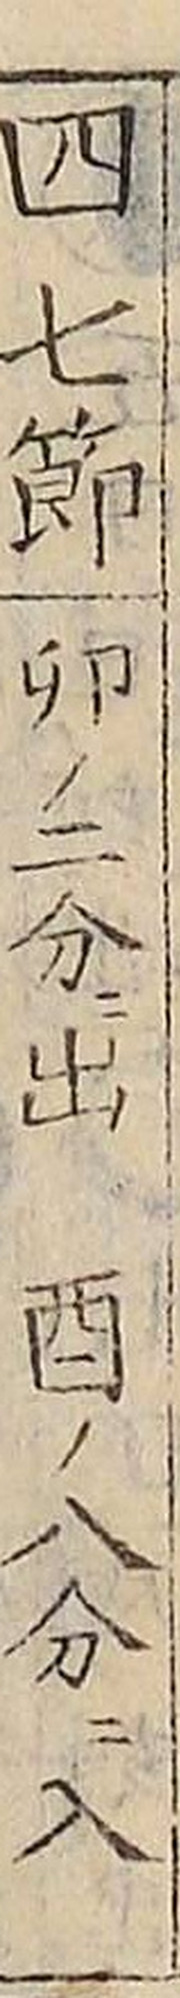四七節卯ノ二分出酉ノ八分入
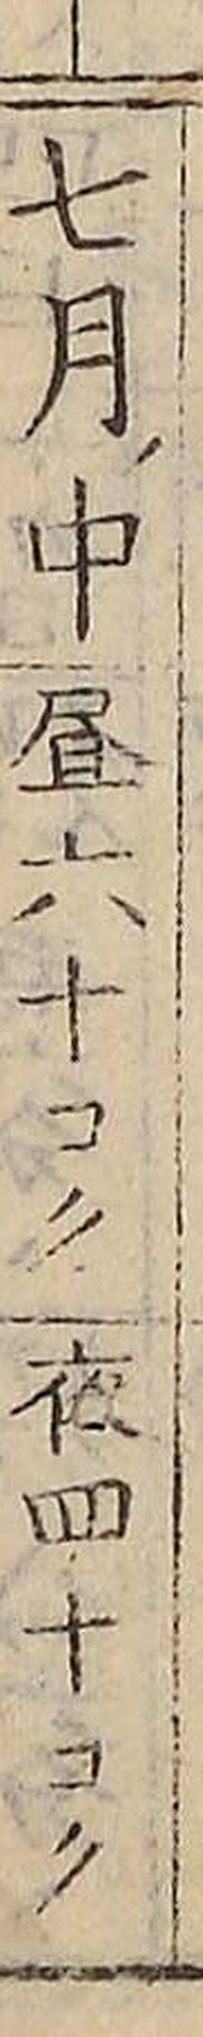七月中昼六十コク夜四十コク
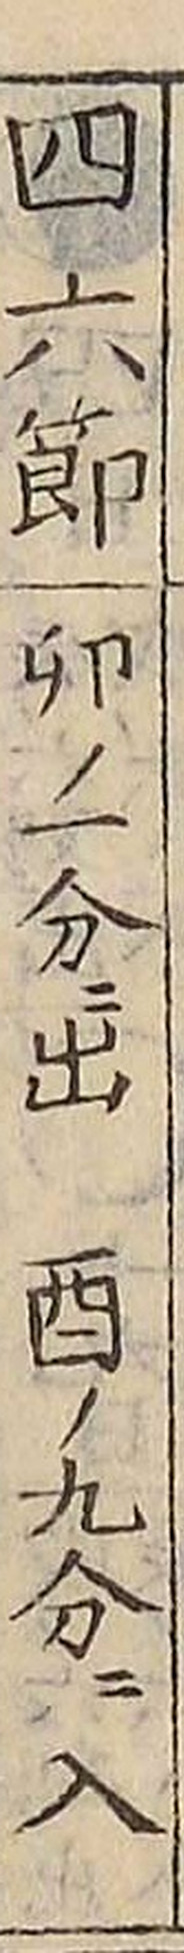四六節卯ノ一分出酉ノ九分入
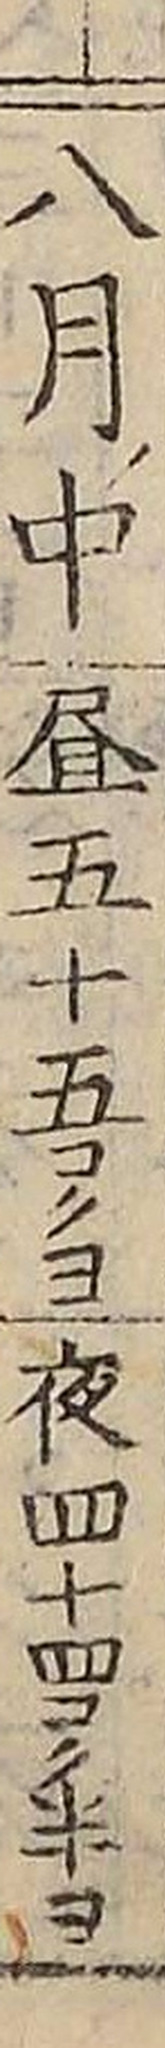八月中昼五十五コクヨ夜四十四コク半ヨ
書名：旅行用心集
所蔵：神戸大学附属図書館 国文学研究資料館
